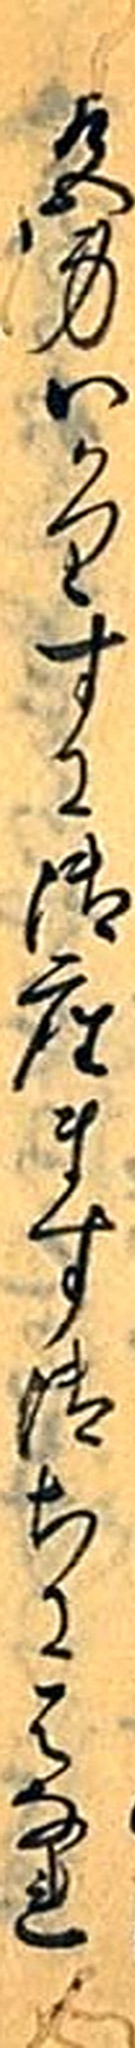色身はかりすに御座ます御ちにはなれ
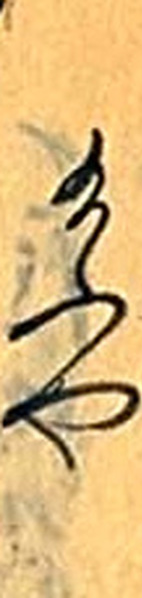給ふや
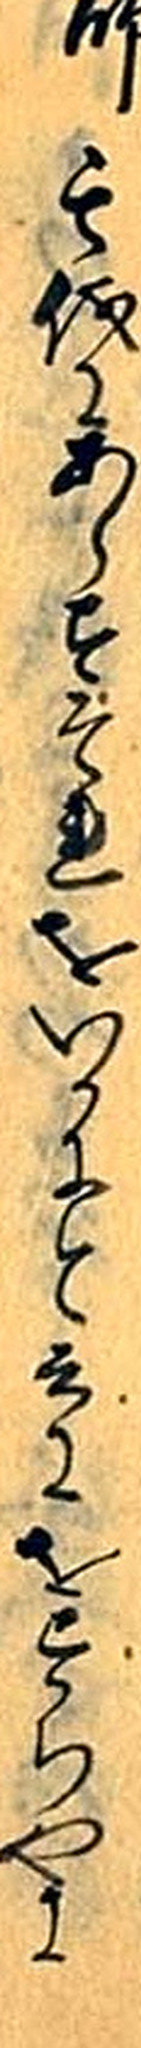師其儀にあらすそれをいかにと云にをすちやに
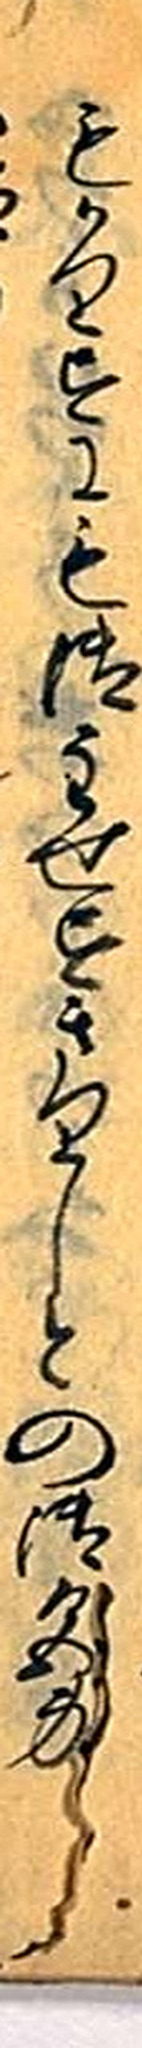もかりすにも御主せすきりしとの御色身
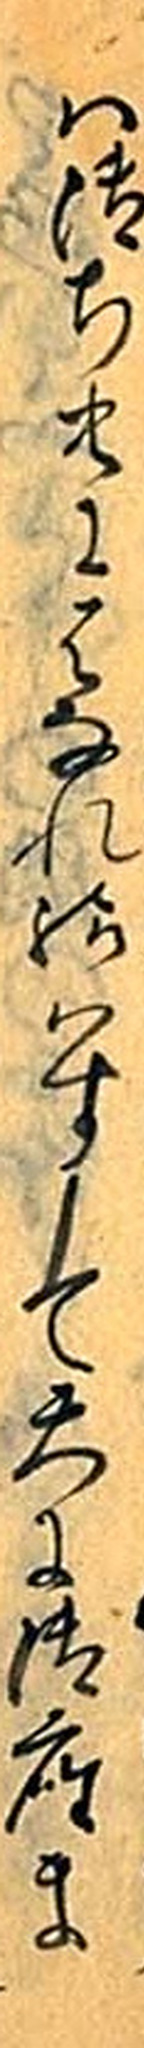は御ち共にはなれ給はすして天に御座ま
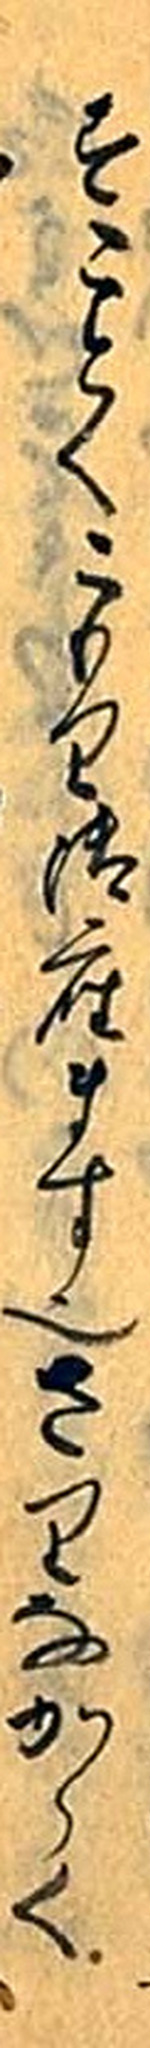すことくこもり御座ます也さりなからく
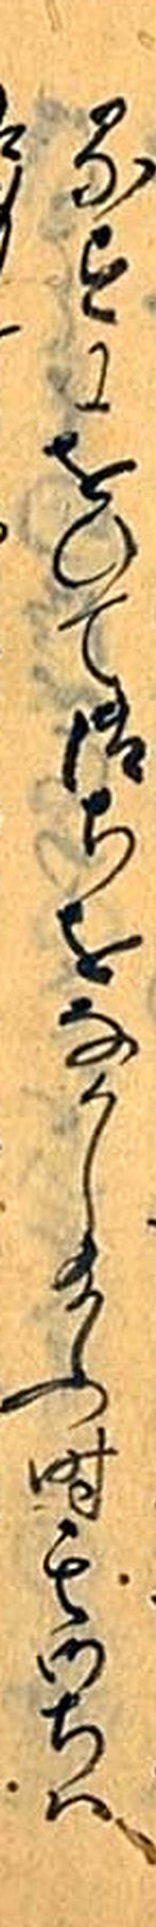るすにをひて御ちをなかし給ふ時其御ちは
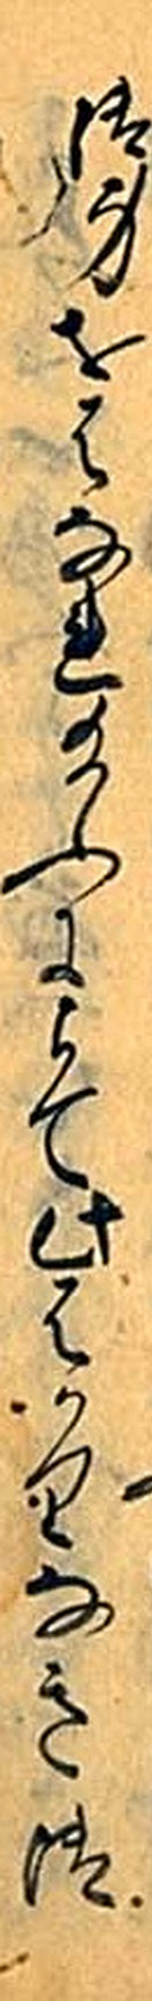御身をはなれ給ふによて此はかりなき御
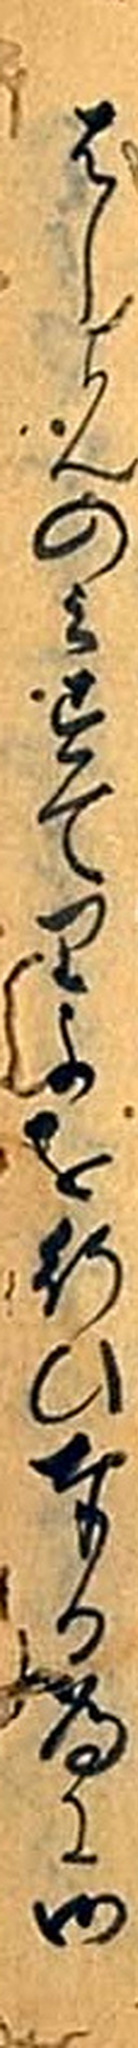はしよんのみすてりよを行ひ奉る為に御

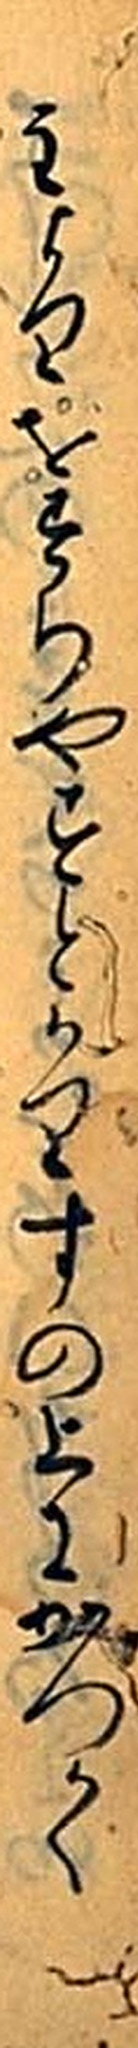主よりをすちやすとかりすの上にかつかく
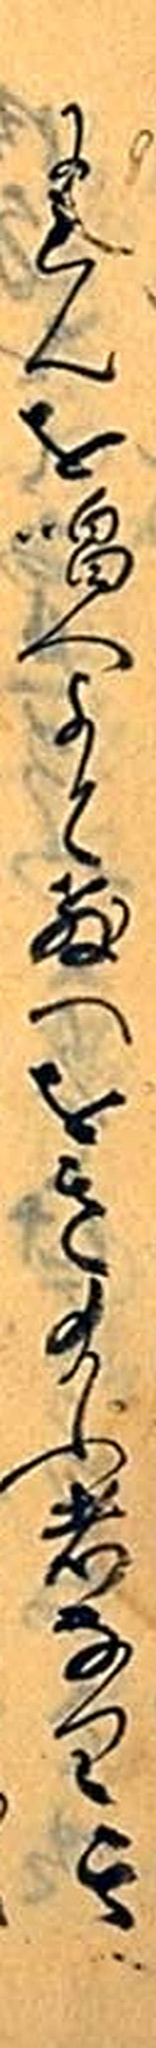にもんを唱へよと教へをき給ふ者なり其
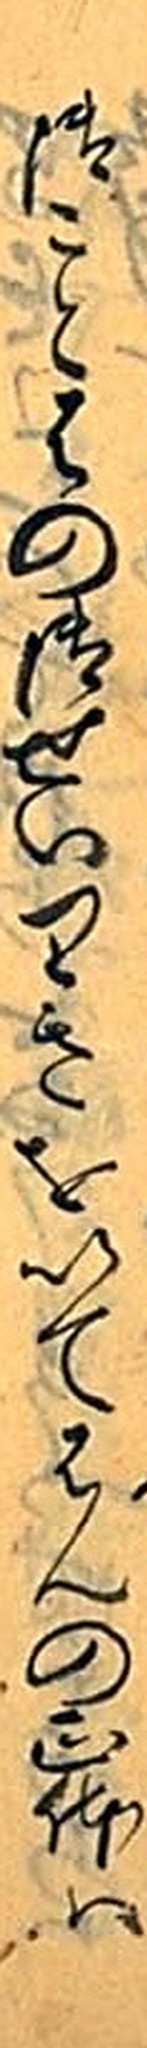御ことはの御せいりきを以てはんの正体は
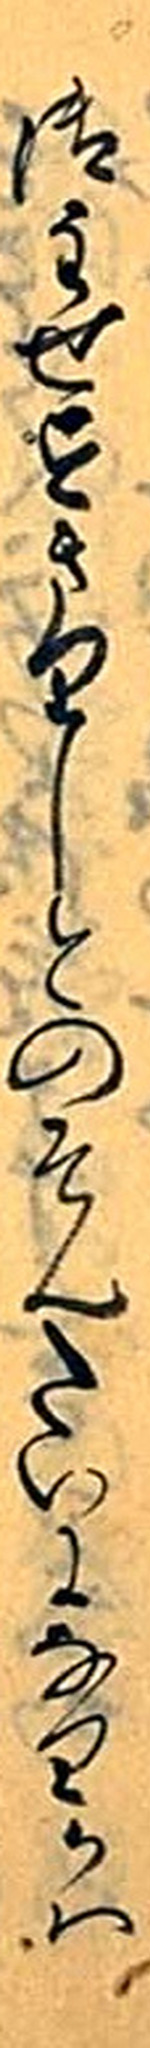御主せすきりしとのそんたいになりかは
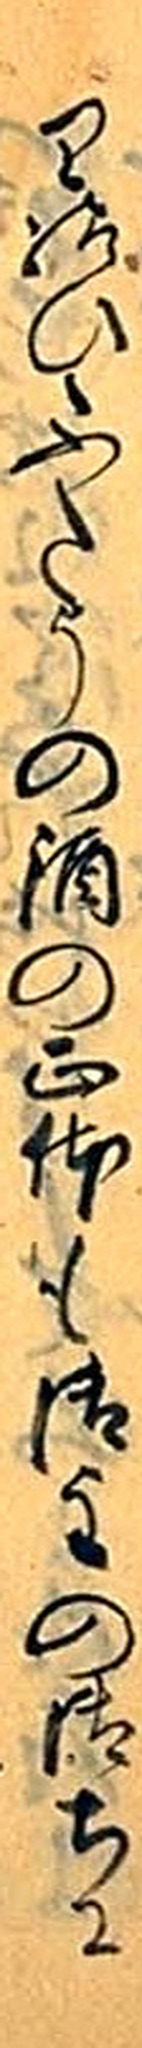り給ひふたうの酒の正体も御主の御ちに
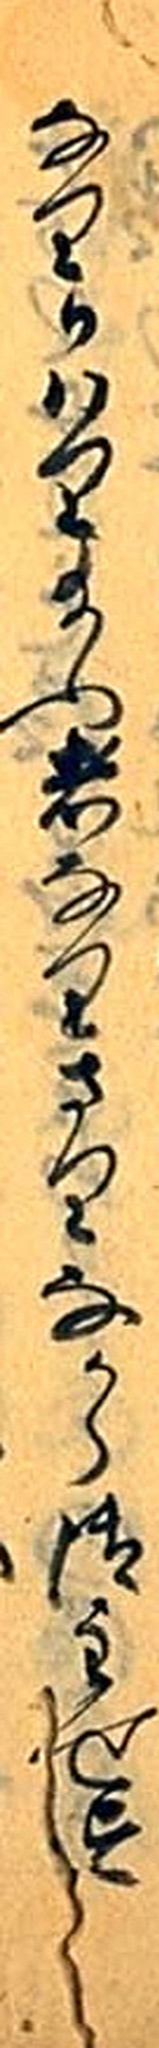なりかはり給ふ者なりさりなから御主せす
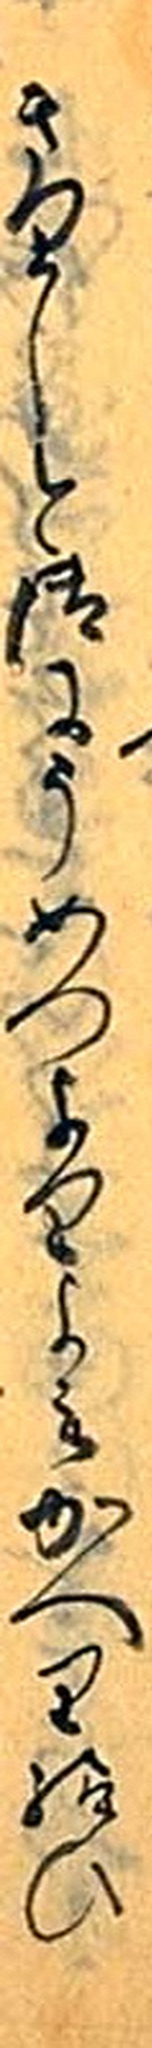きりしと御にうめつよりよみかへり給ひ
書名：ドチリナ・キリシタン
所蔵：東京大学総合図書館 / General Library in the University of Tokyo
